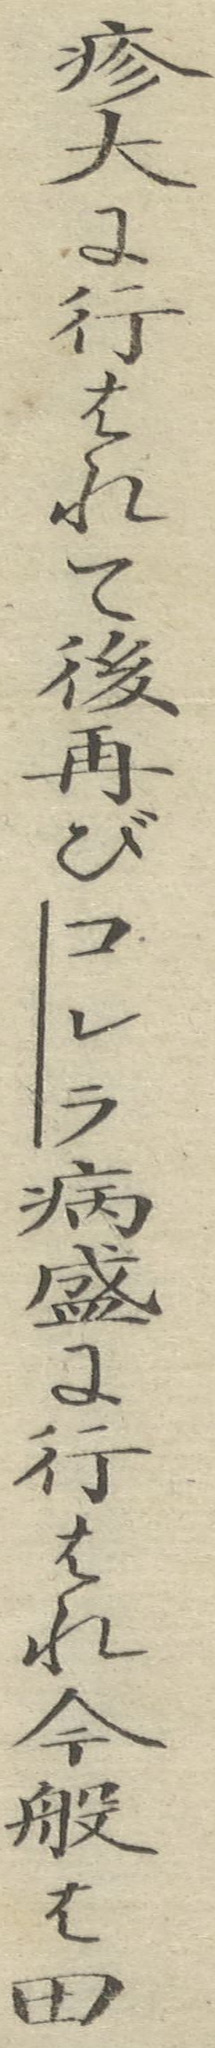疹大に行はれて後再びコレラ病盛に行はれ今般は田
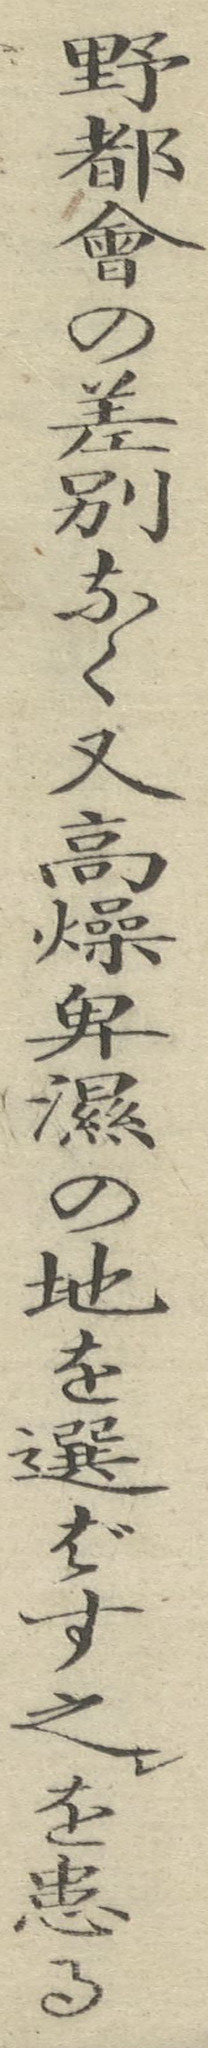野都會の差別なく又高燥卑濕の地を選ばす之患事
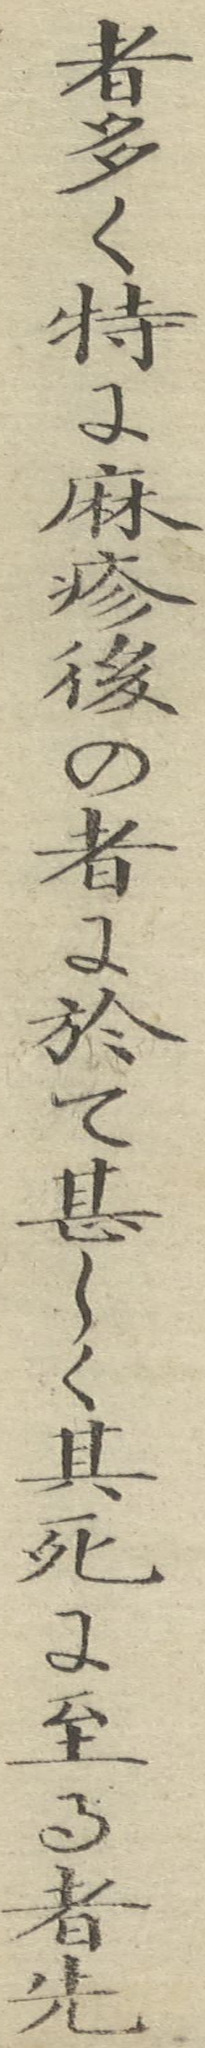者多く特に麻疹後の者に於て甚しく其死に至る者先
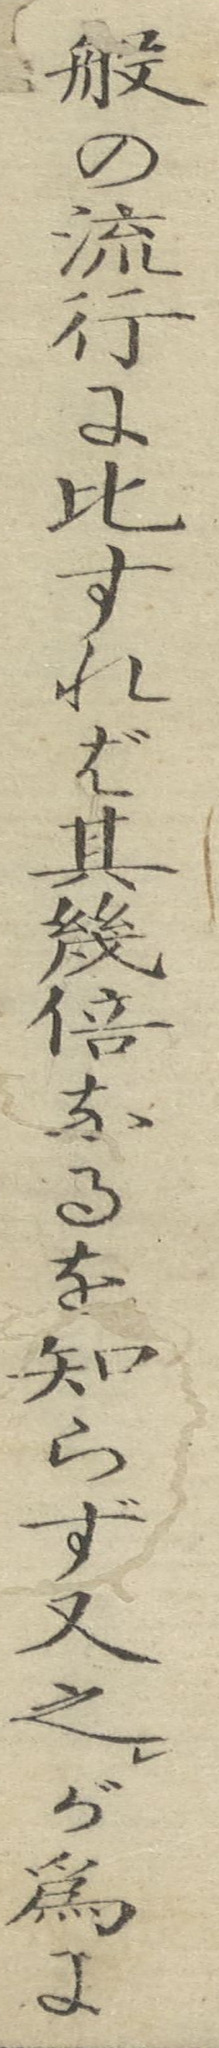般の流行に比すれば其幾倍なるを知らず又之為に

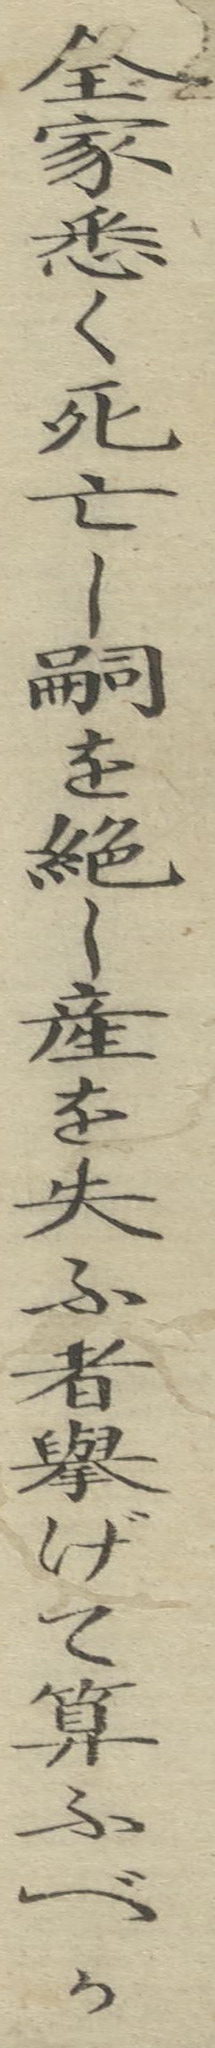全家悉く死亡し嗣を絶し産を失ふ者挙げて算ふべか
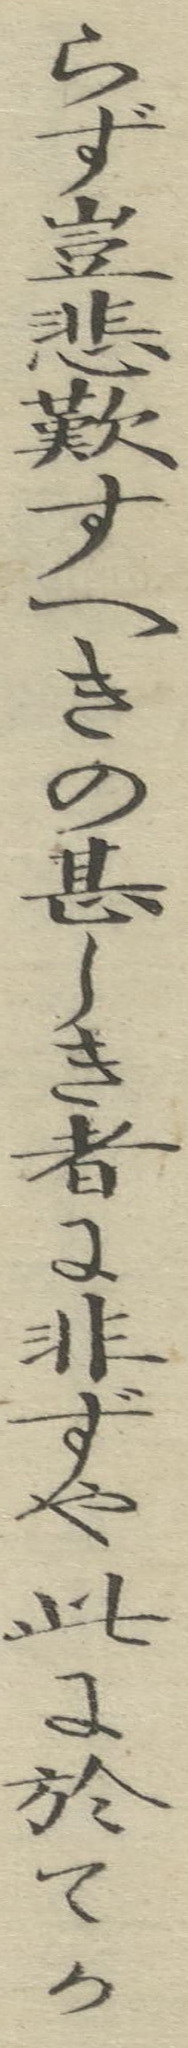らず豈悲歎すへきの甚しき者に非ずや此に於てか
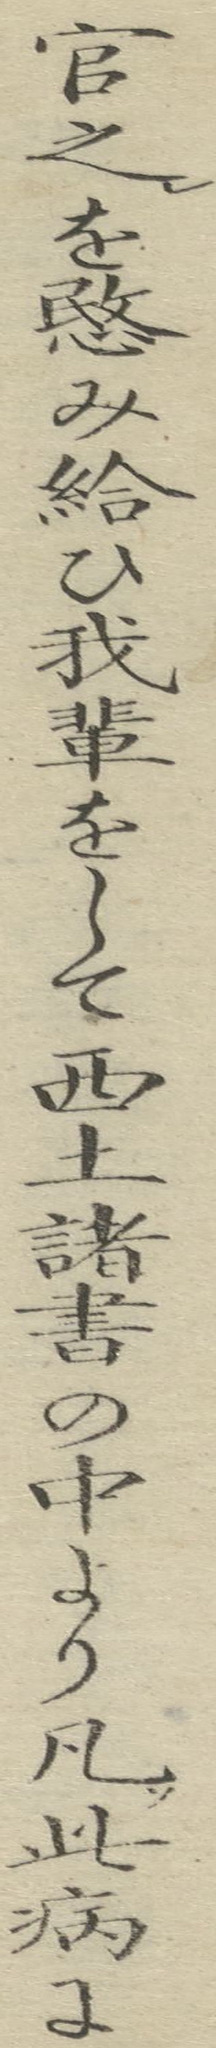官之愍み給ひ吾輩をして西土諸書の中より凡此病に
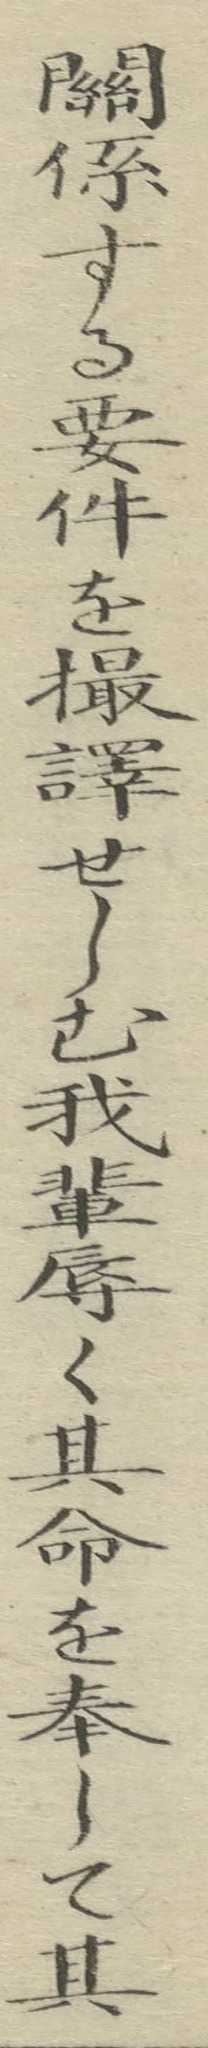関係する要件を撮譯せしむ吾輩褥く其命を奉して其
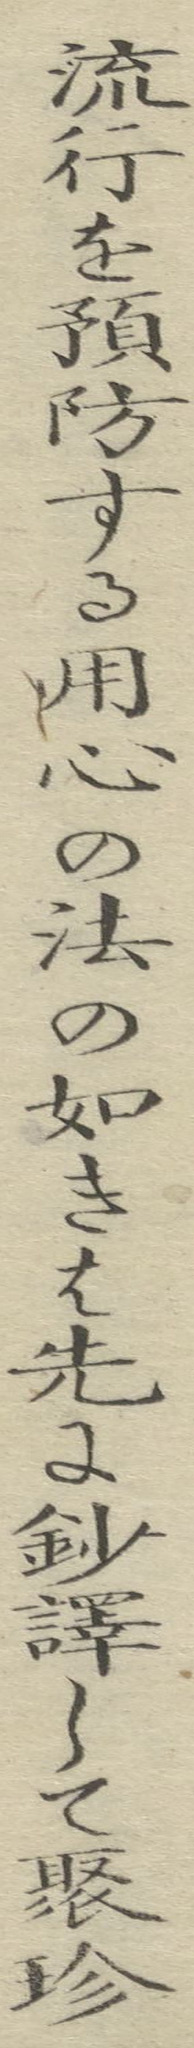流行を預防する用心の法の如きは先に鈔譯して聚珍
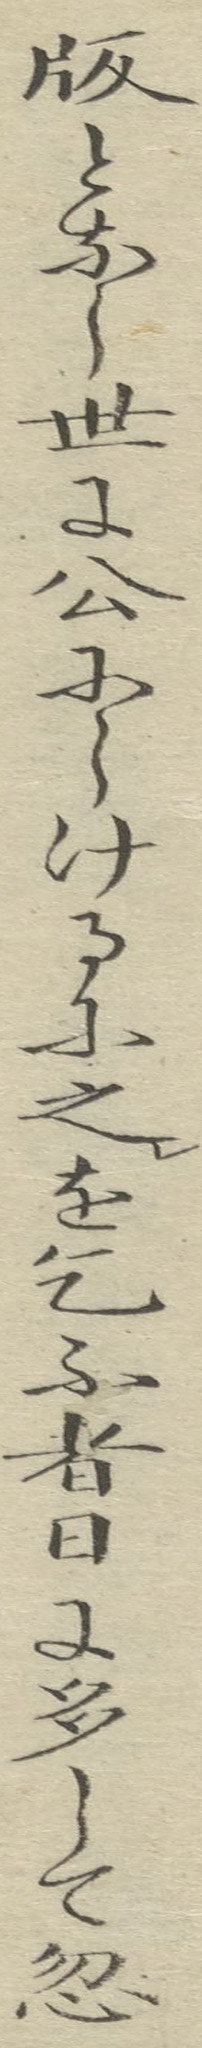版となし世に公にしけるに之乞う者日に多くして忽
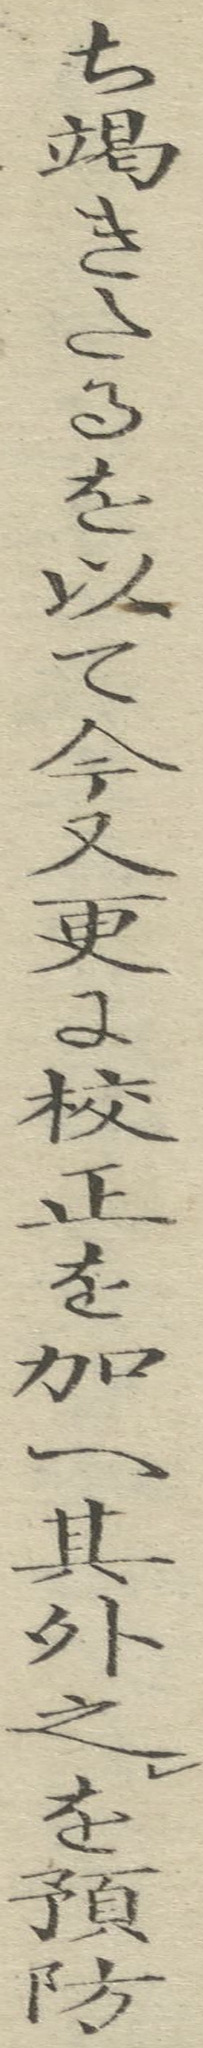ち竭きたるを以て今又更に校正加へ其外之
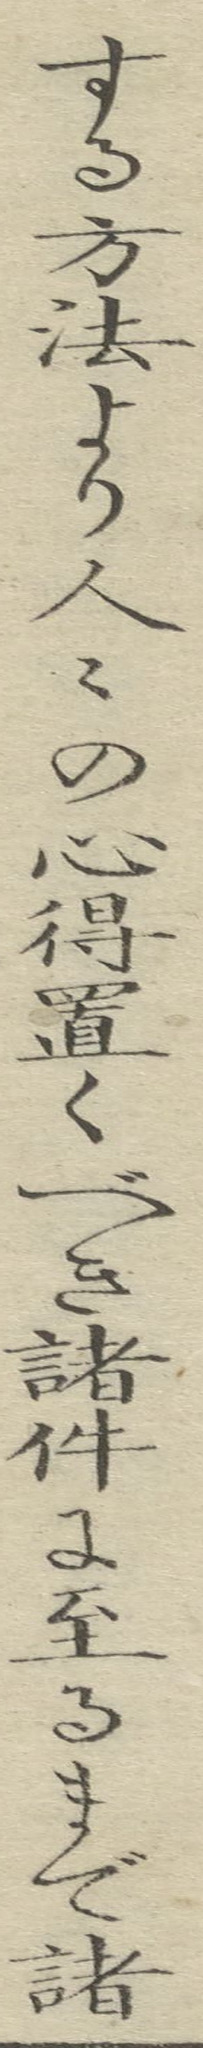する方法より人々の心得置くき諸件に至るまで諸
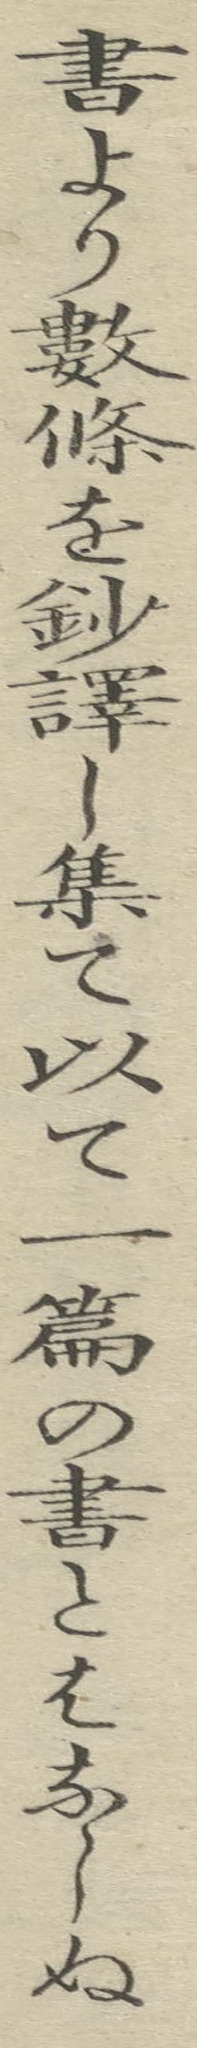書より數條を鈔譯し集て以て一篇の書とはなしぬ
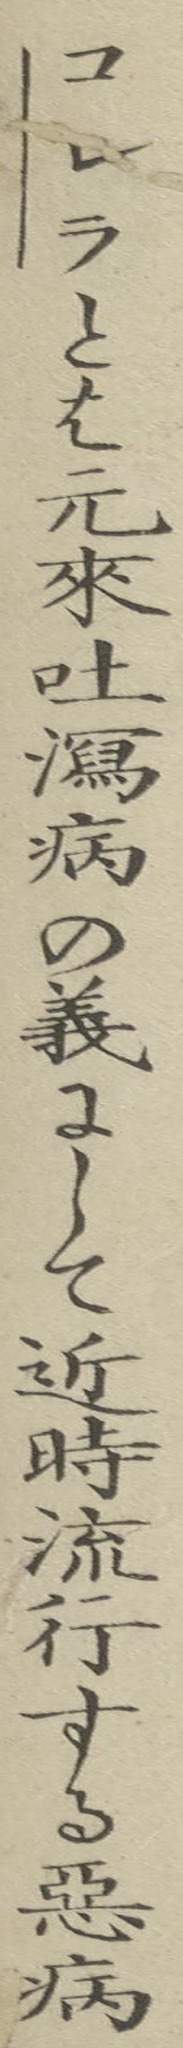一コレラとは來吐瀉病の義にして近時流行する惡病
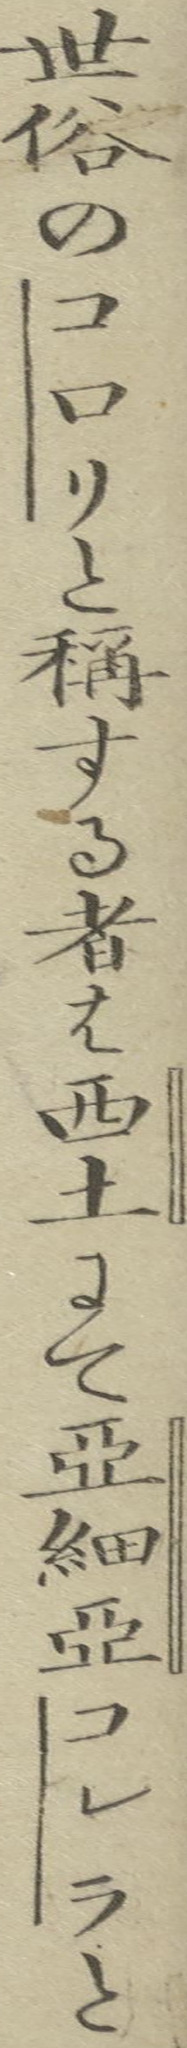世俗のコロリと稱する者は西土にて亜細亜コレラと
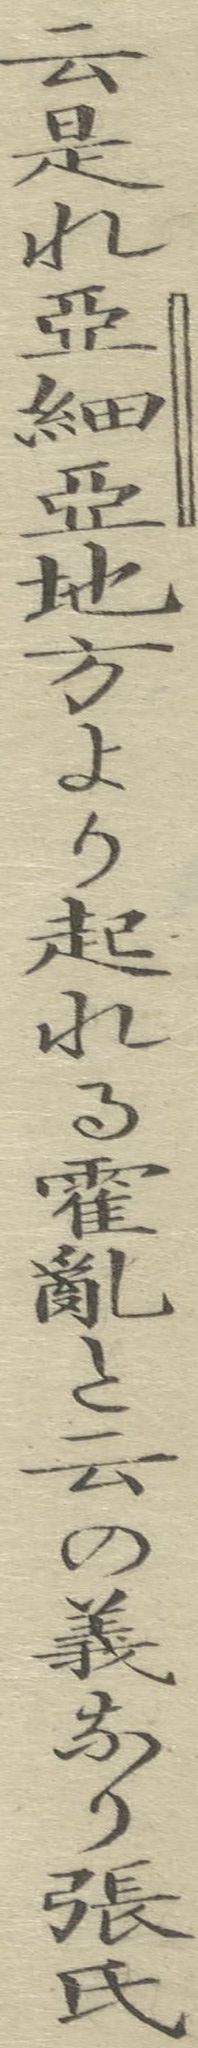云是れ亜細亜地方より起れる霍乱と云の義なり張氏
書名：官版疫毒預防説　全
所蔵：東京大学総合図書館 General Library in the University of Tokyo, JAPAN
